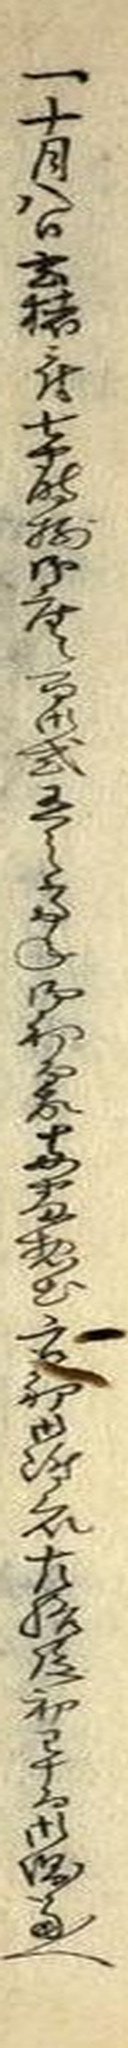一十月八日玄猪ニ付七半時揃御座之間御式有之当年初而故両番惣出最初御附衆左膳殿初畢而御側御用人
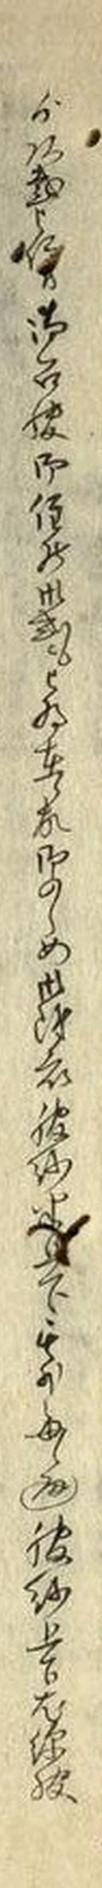ゟ頂戴被仰付御召服御住居御式も被為在候故御のしめ御附衆服紗半上下其外毎之通服紗上下尤綿服
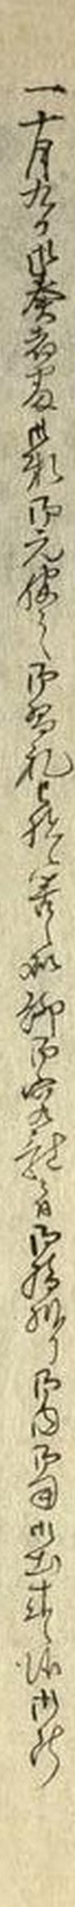一十月九日御奏者番御頼御元服之御習礼被遊候筈之処聊御容体ニ付御指掛り御内御用御出来候趣御断
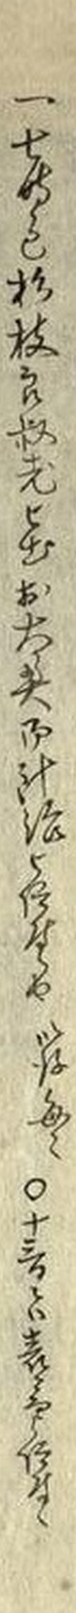一七時過杉枝良叔老被出於大奥御針治被仰付候也以後毎々〇十三日ニハ表ニ而被仰付候
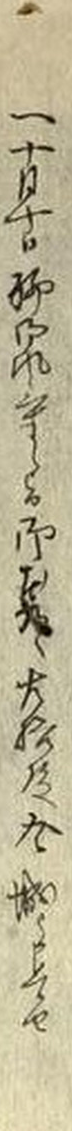一十月十日聊御風気之旨御本丸へ左膳殿登城被申上候由
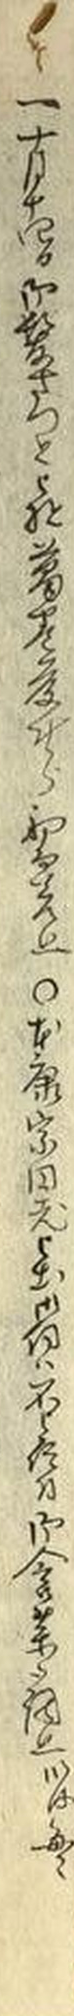一十月十四日御髪さつと被遊葛巻藤十郎初而差上〇本康宗因老被出御伺ハ不被仰付御含薬御調上以後毎々
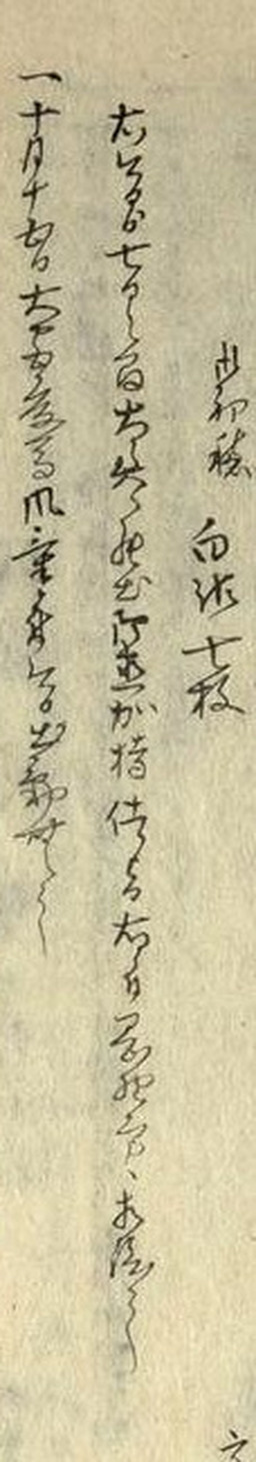右今日ゟ七日之間大奥へ罷出御直加持仕候旨右ニ付岡野方へ相渡之
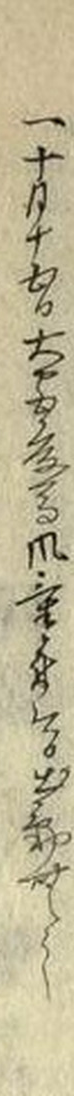一十月十五日大宮藤馬風気ニ付今日出勤無之
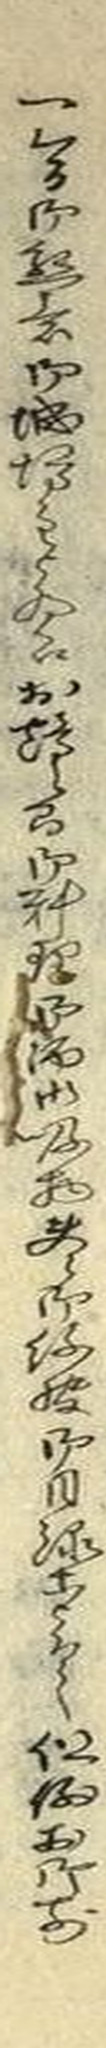一今日御懇意御城坊主被為召於鶴之間御料理御酒御吸物夫々御紋服御目録等被下之但例於御前
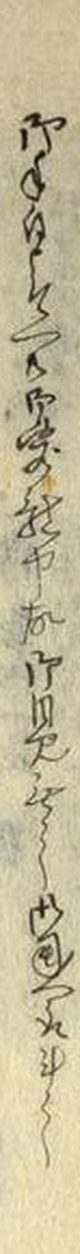御手自被下候へ共御容体中故御目見無之御用人取計之
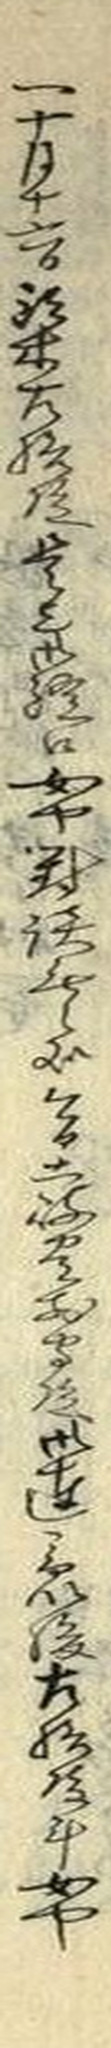一十月十六日鈴木左膳殿是迄御錠口女中対談無之処今日土岐豊前守殿御達ニ而以後左膳殿斗女中
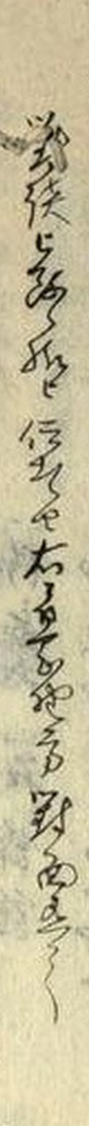対談被致候様被仰付候由右ニ付岡野方対面有之
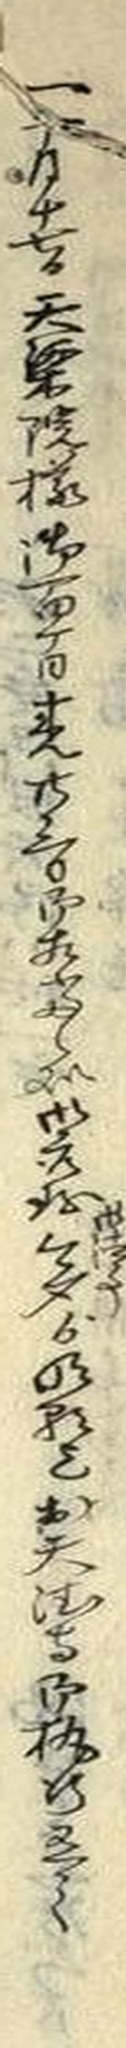一十月十七日天梁院様御百ケ日来ル廿三日御相当之処御取越御法事今夕ゟ明朝迄於天徳寺御執行有之
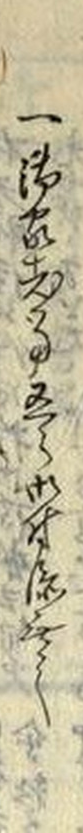一御家老御用有之御付添無之
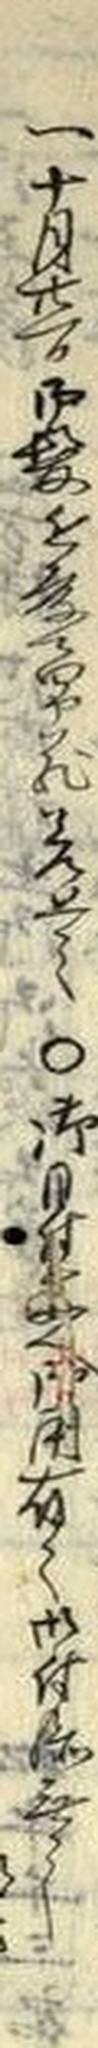一十月廿一日御髪近藤勇蔵差上之〇御目付両人御用有之御付添無之
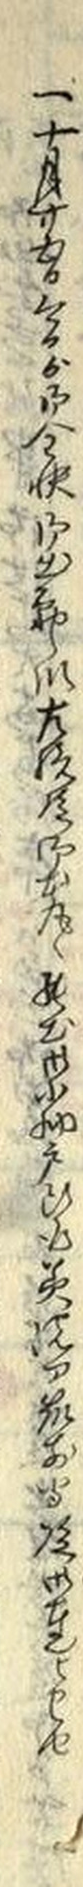一十月廿五日今日ゟ御全快御出勤之段左膳殿御本丸へ罷出御小納戸頭取美濃部筑前殿御達被申候由
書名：少傅日録抄（斉善付側向頭取日記、在府）
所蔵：福井県文書館 Fukui Prefectural Archives
